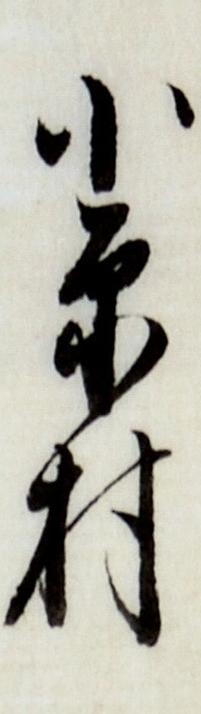小原村
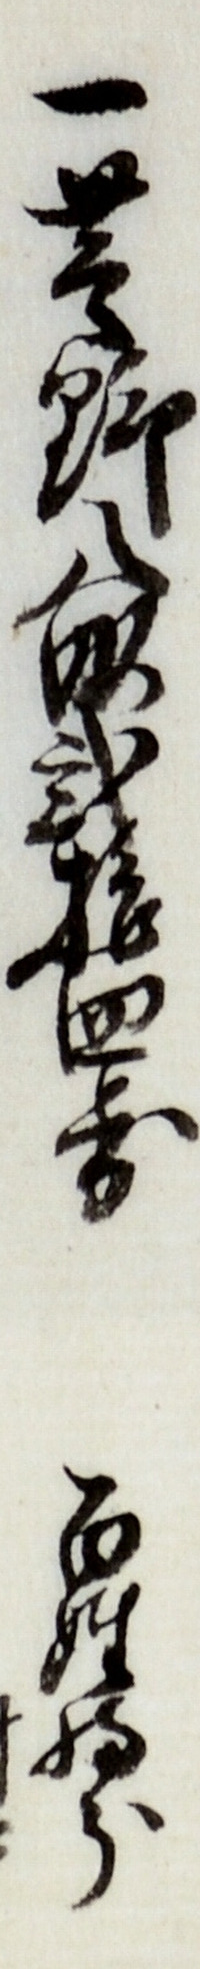一芝野八畝弐拾四歩百姓持分
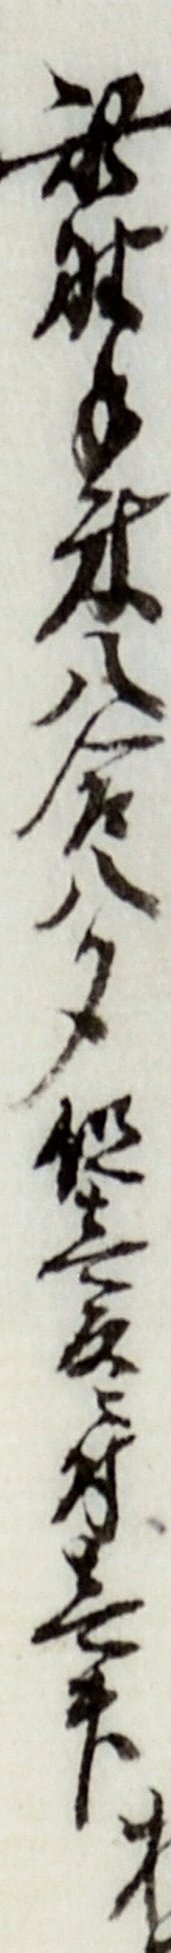此野手米八合八夕但壱反ニ付壱升
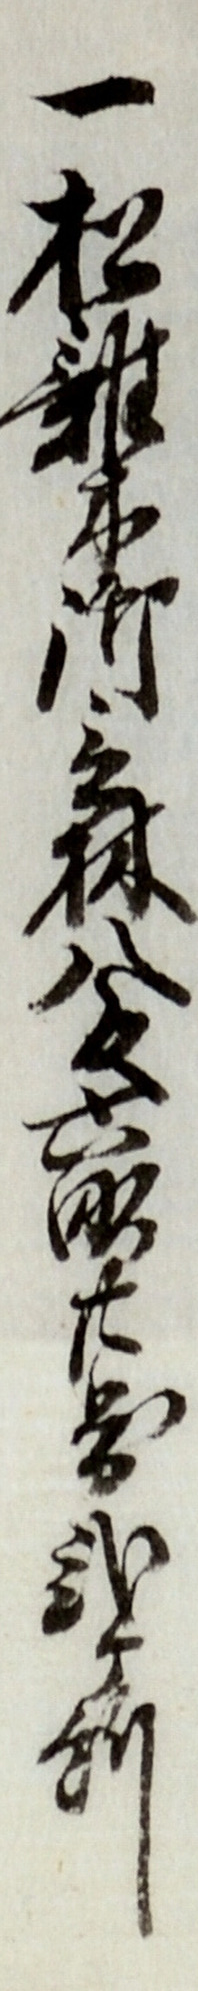一松雑木御立林八反六畝廿歩弐ヶ所
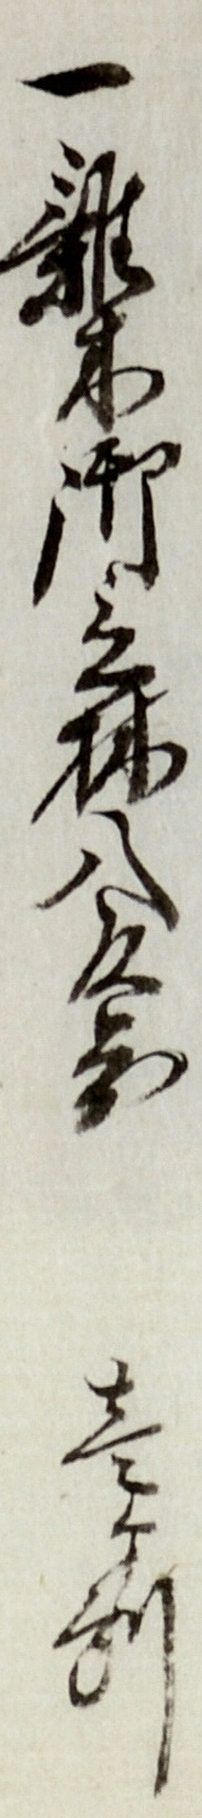一雑木御立林八反歩壱ヶ所
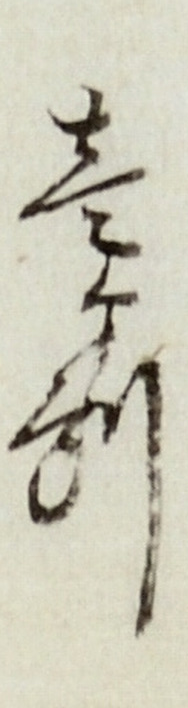壱ヶ所
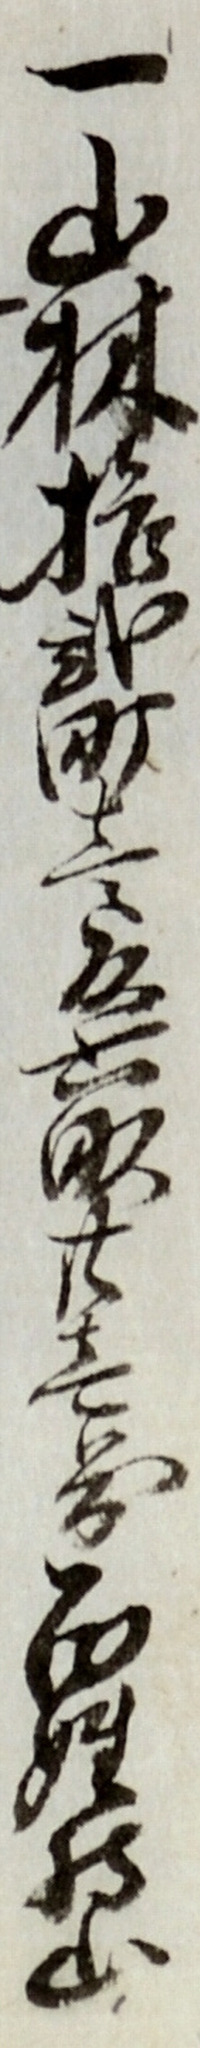一山林拾弐町壱反六畝廿壱歩百姓持山
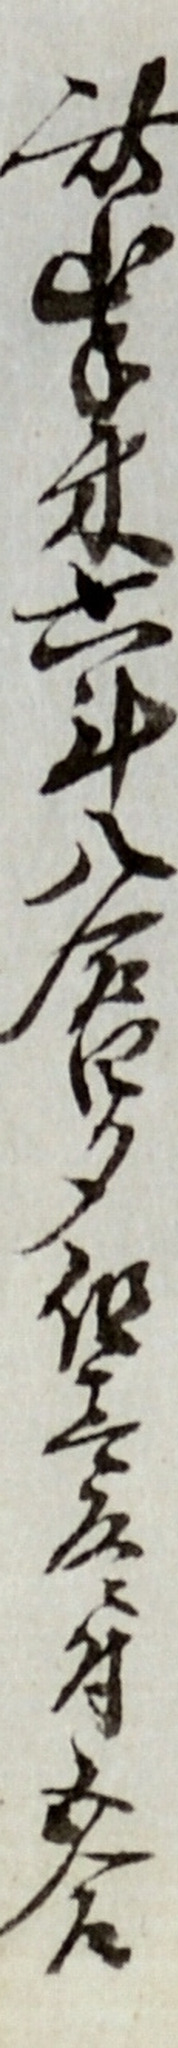此山手米六斗八合四夕但壱反ニ付五合
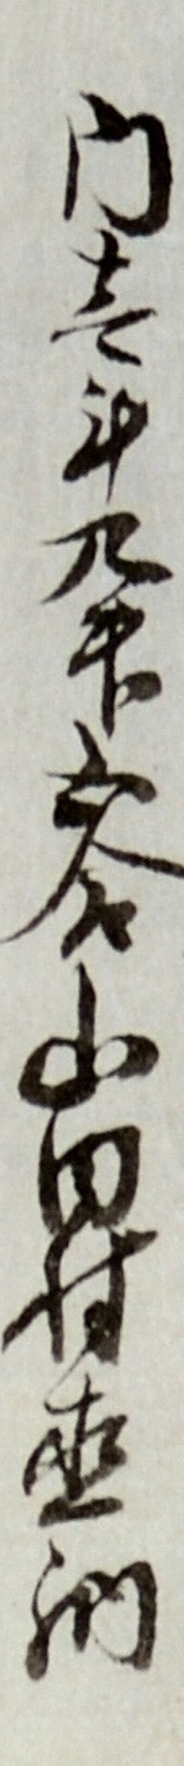内壱斗九升五合山田村直納
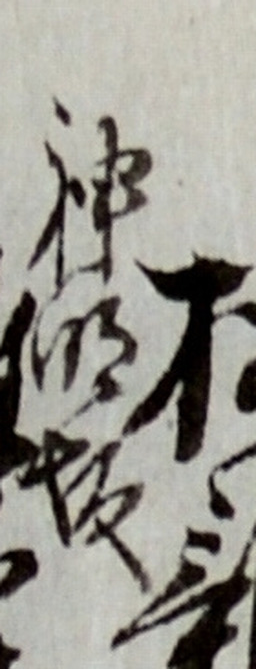神明坂
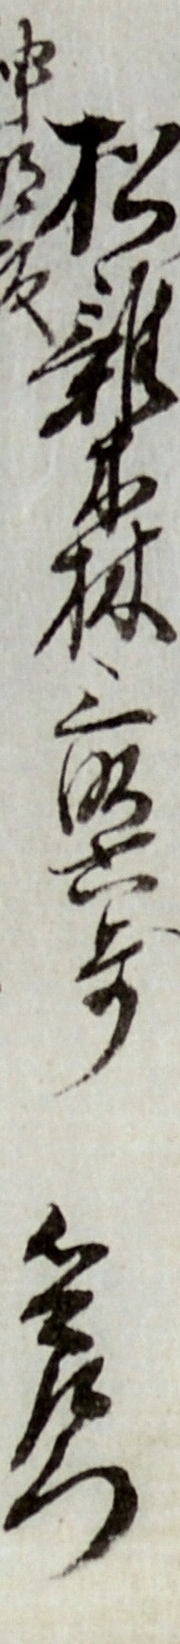松雑木林三畝六歩笠左衛門
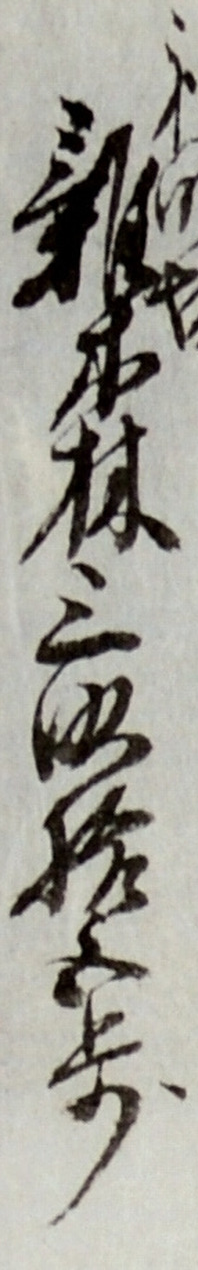雑木林三畝拾五歩村中
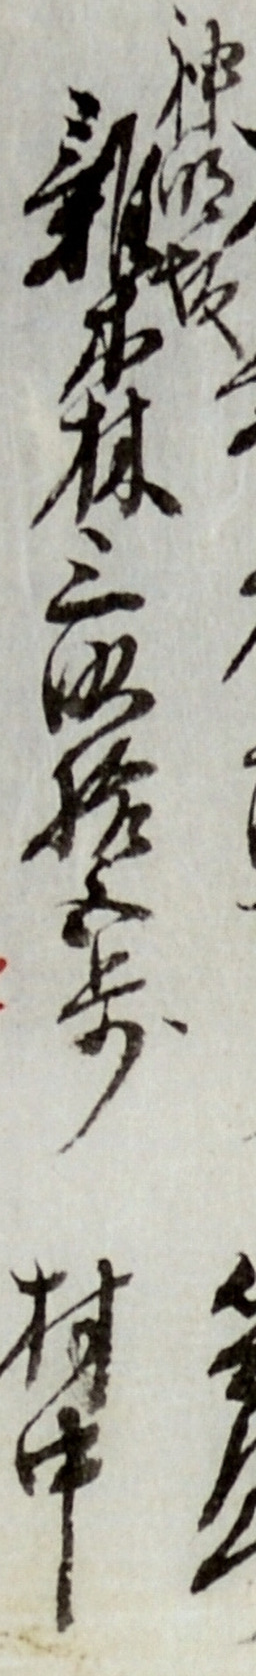雑木林三畝拾五歩村中

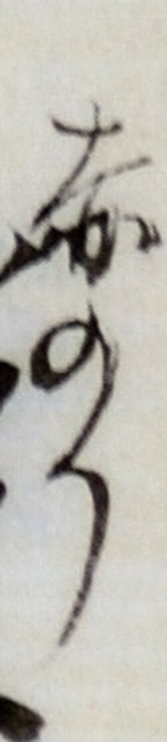赤のり
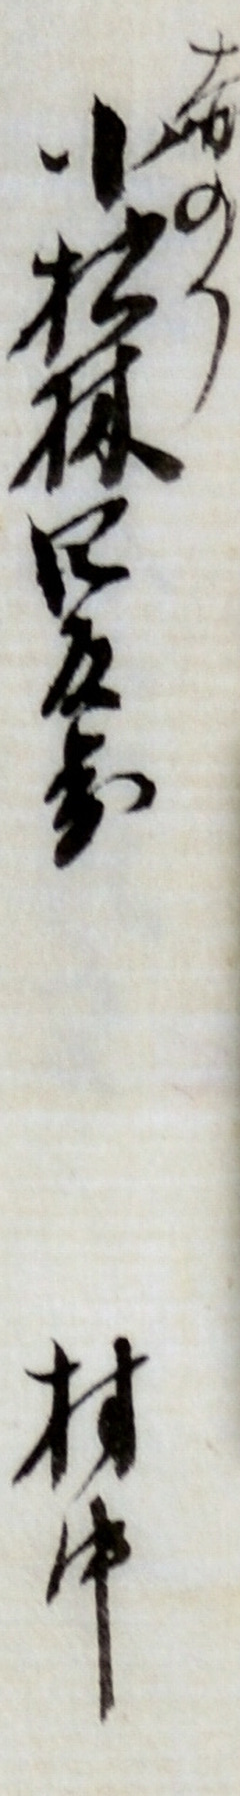小松林四反歩村中
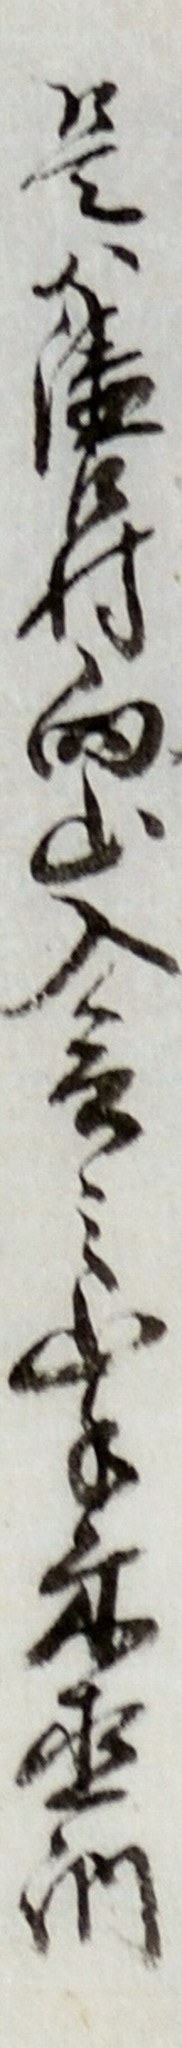是ハ溝口村向山入会之山手米直納
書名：御領分中山林社地手控
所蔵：伊那市立高遠町図書館・合同会社AMANE
